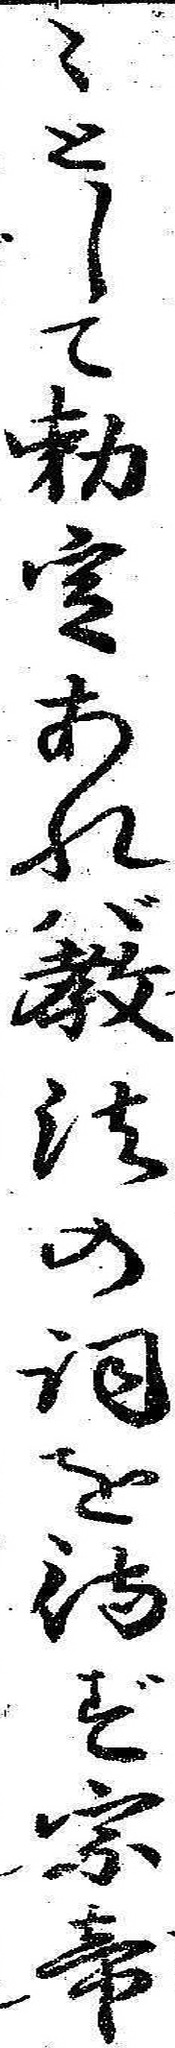々として勅定あれば教法の詞を待ず宗帝
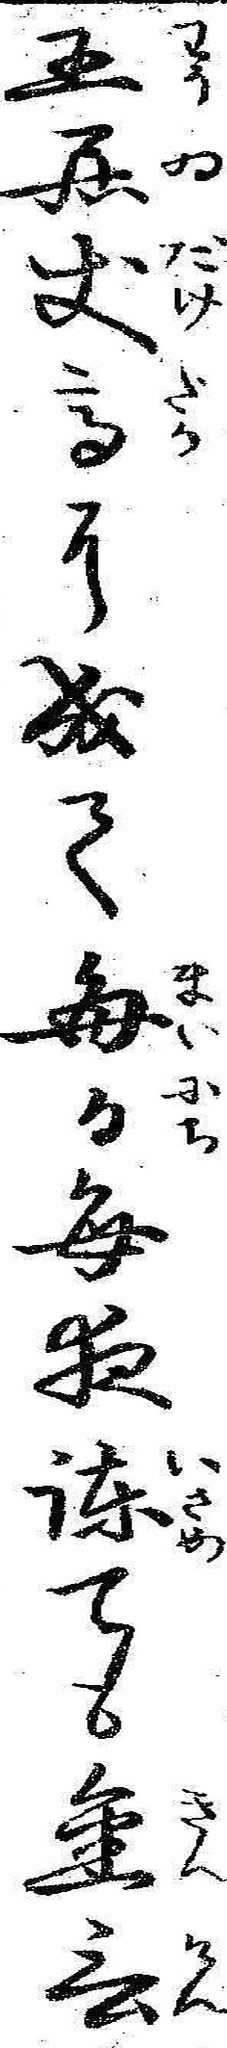王居丈高に成て毎日毎夜諌ても金言
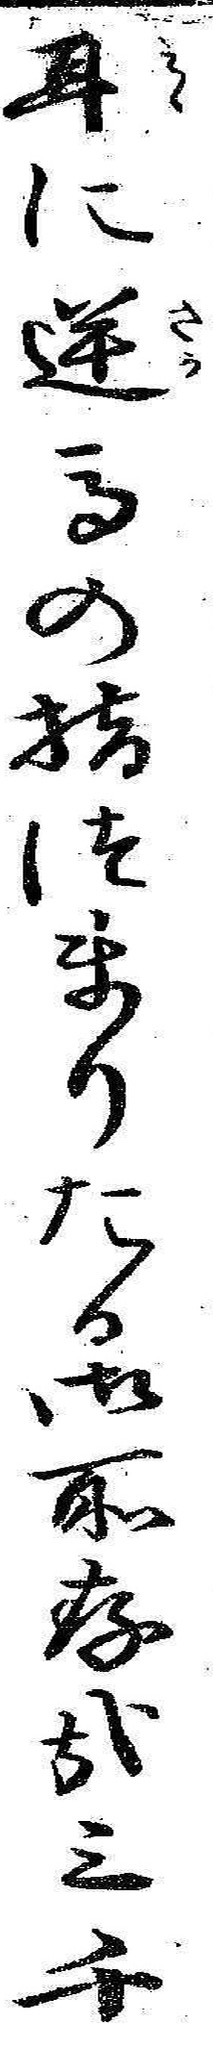耳に逆馬の指つまりたる御所存哉三千
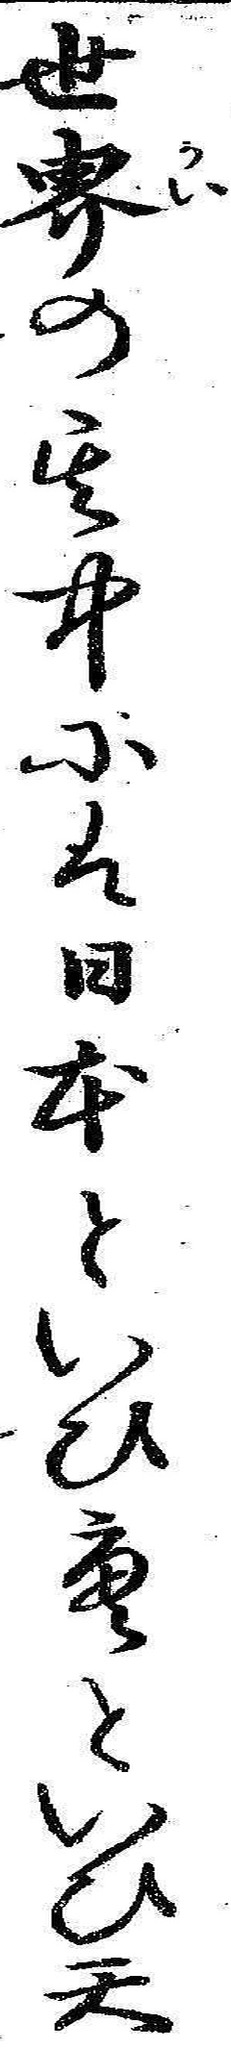世界の其中には日本といひ唐といひ天
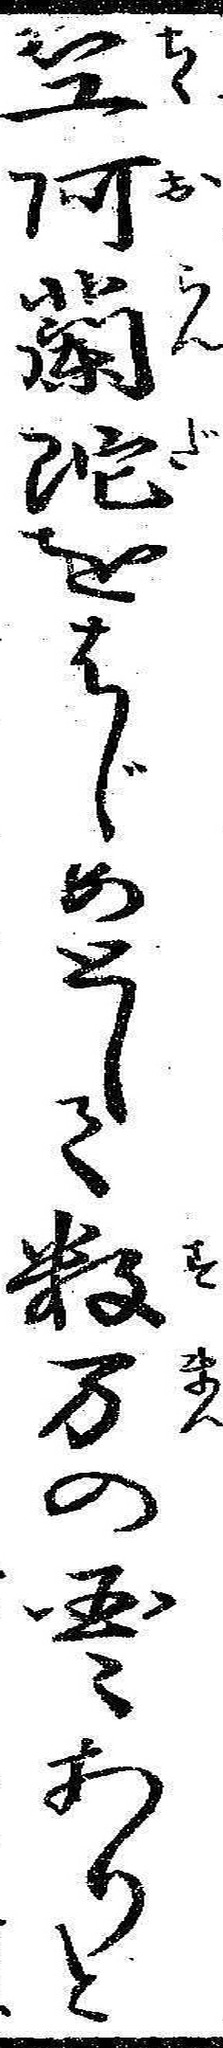竺阿蘭陀をはじめとして数万の国々ありと
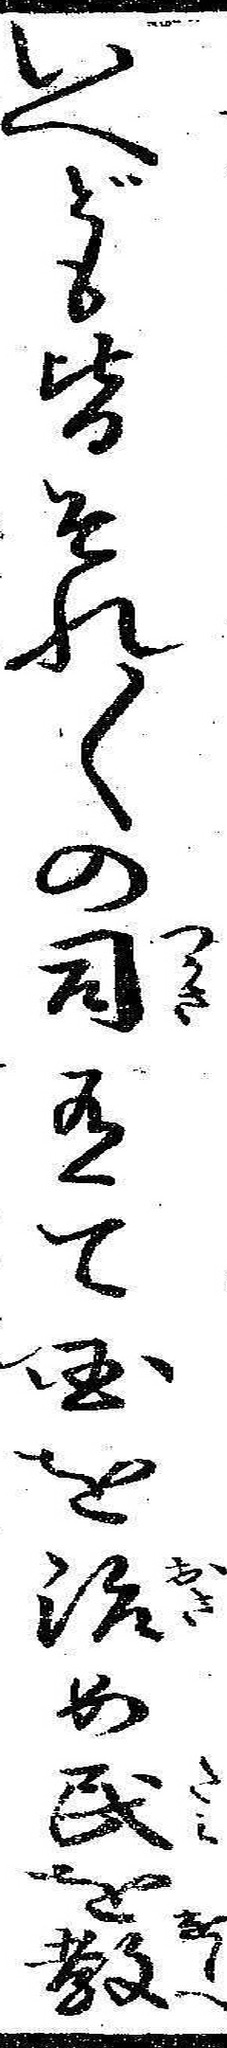いへども皆それ〱の司有て国を治め民を教
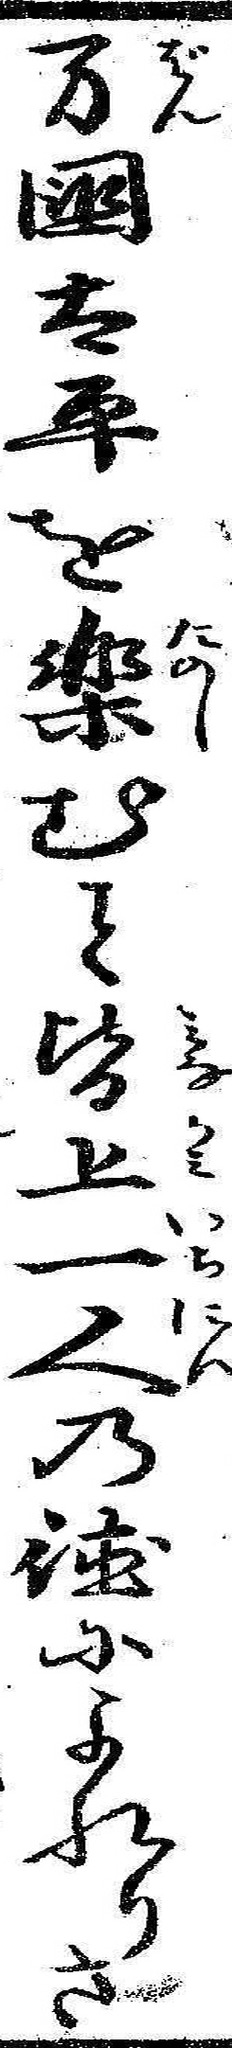万国太平を楽むこと皆上一人の徳によれりさ
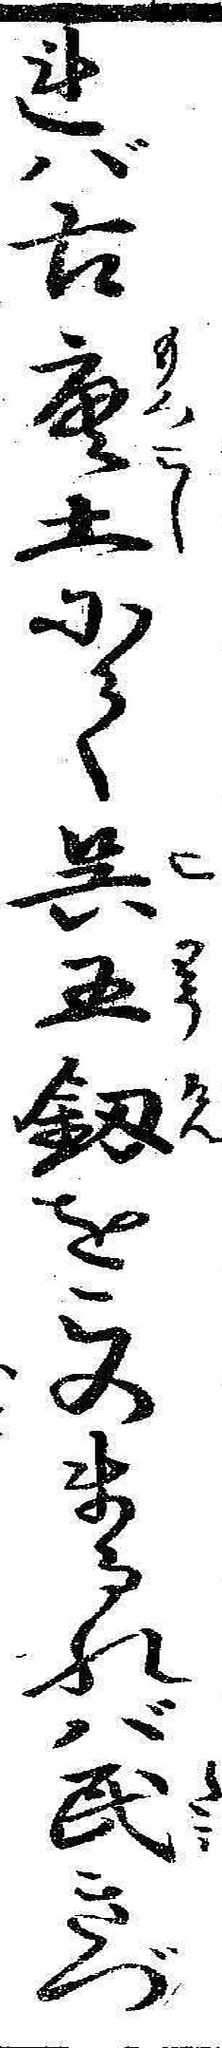れば古唐土にて呉王剣をこのまるれば民きづ
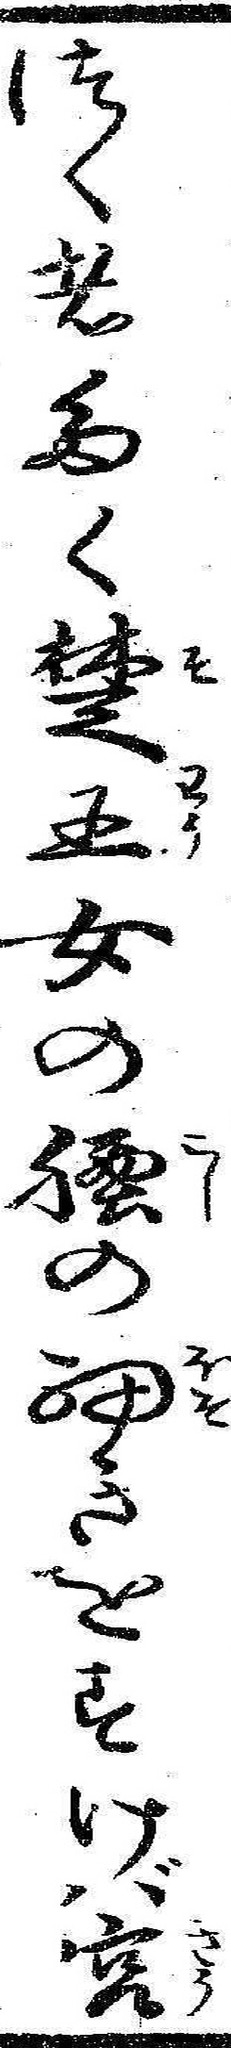つく者多く楚王女の腰の細きをすけば宮
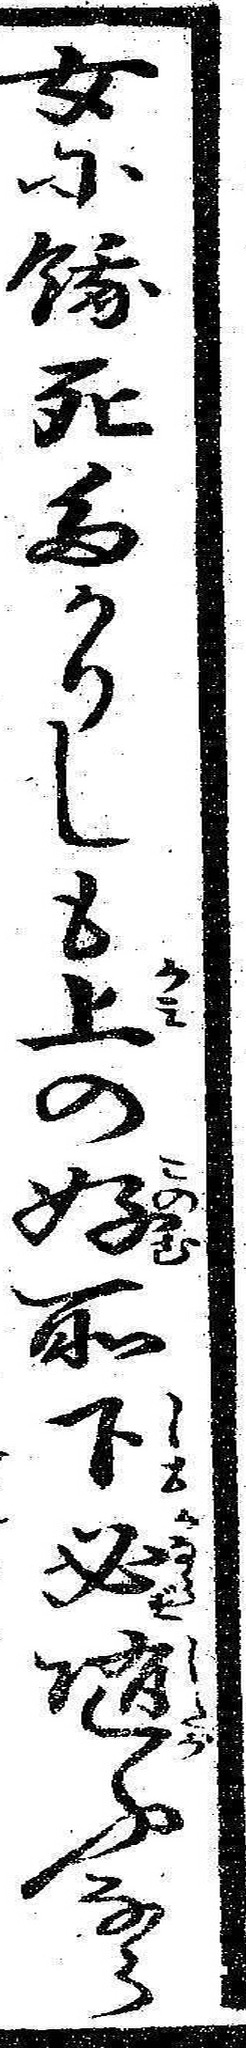女に餓死多かりしも上の好所下必随ふなら
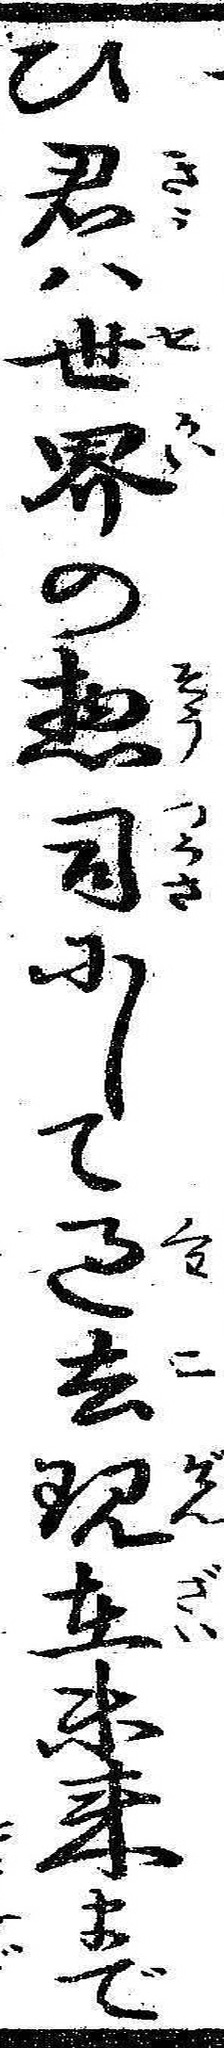ひ君は世界の惣司にして過去現在未来まで
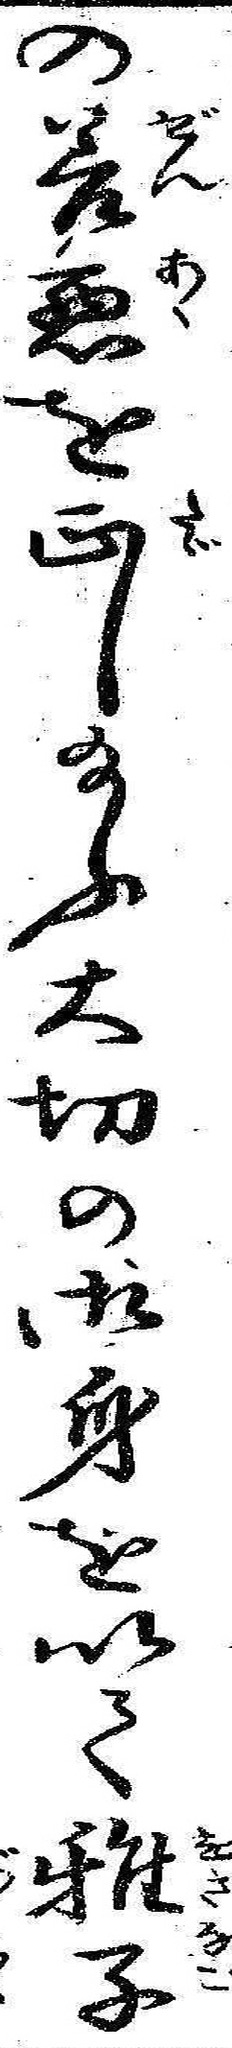の差悪を正し給ふ大切の御身を以て稚子
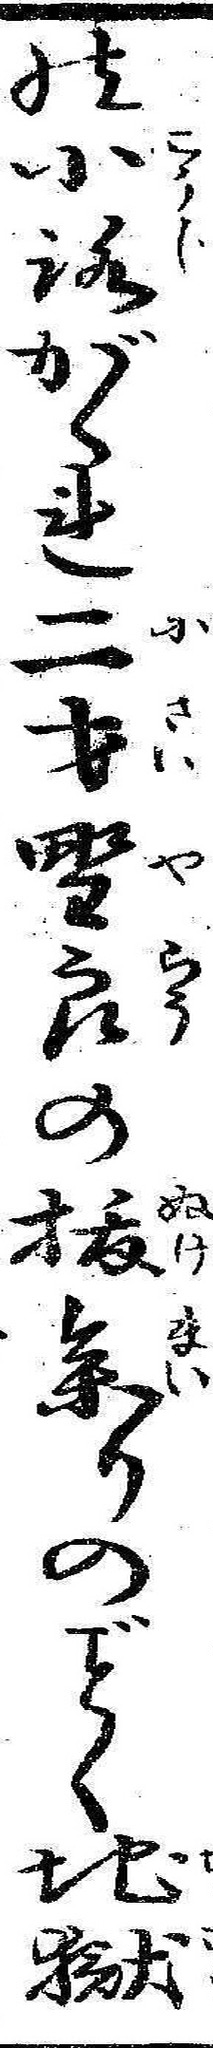の小路がくれ二才野郎の抜参りのごとく地獄
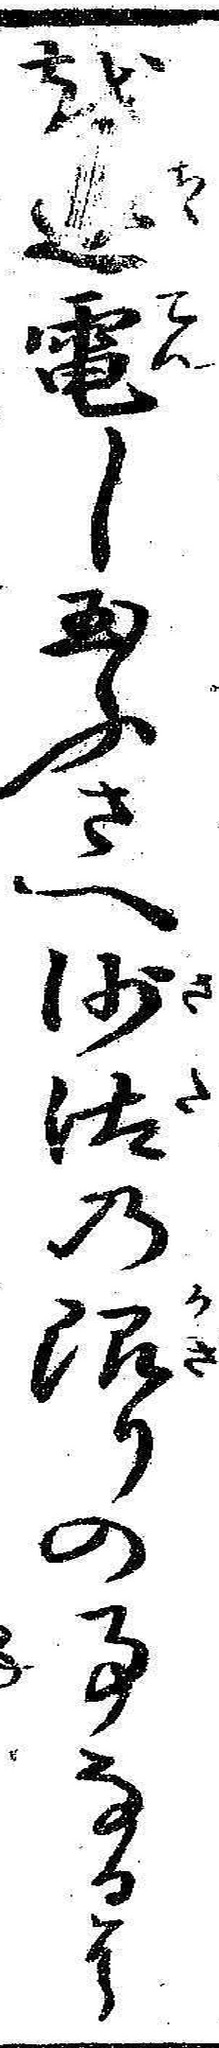を逐電し玉ふさへ沙汰の限りの事なるに
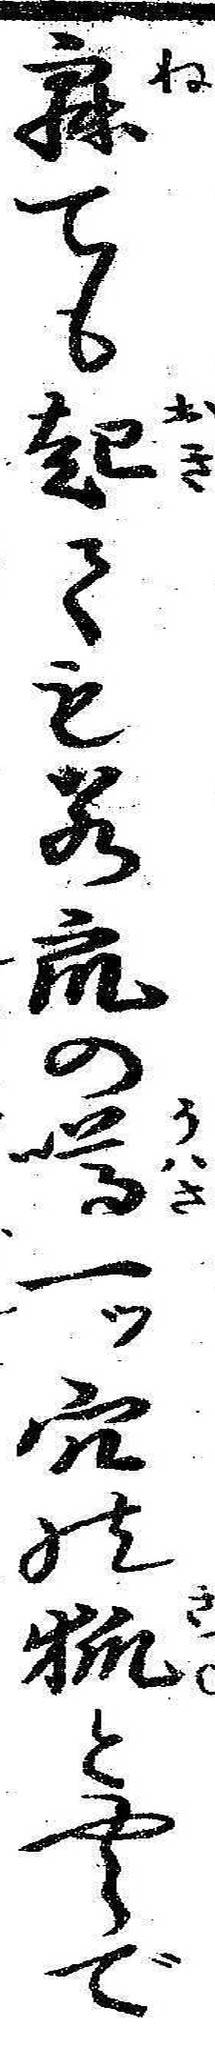寝ても起ても若衆の噂一ッ穴の狐とやらで
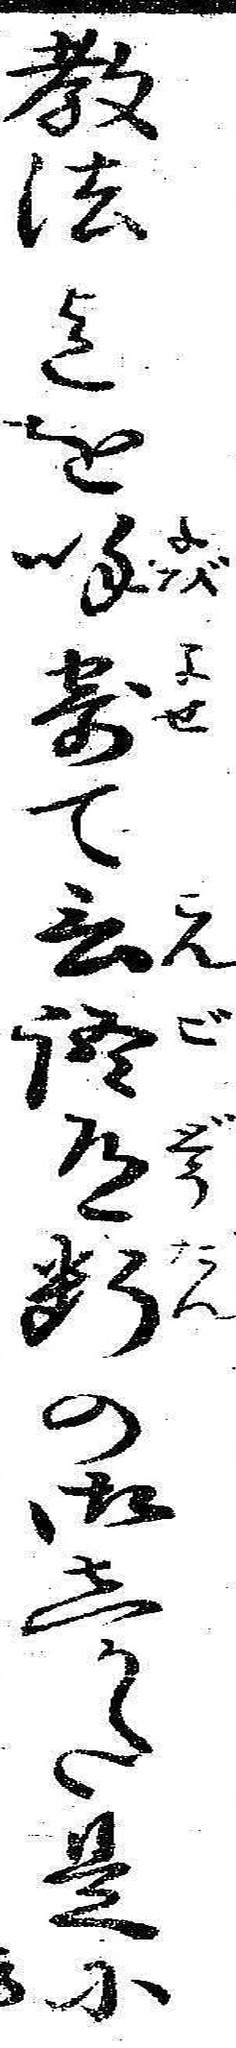教法迄を呼寄て言語道断の御しかた是に
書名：根無草後編
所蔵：国文学研究資料館
